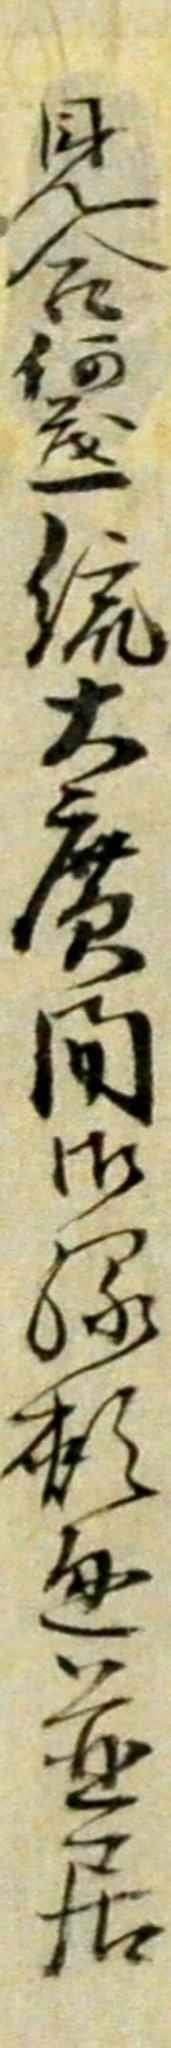見合何も一統大広間御縁頬通並居
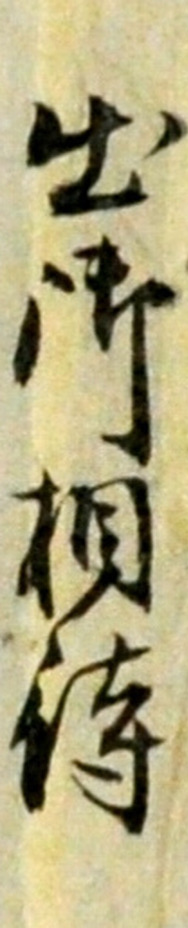出御相待
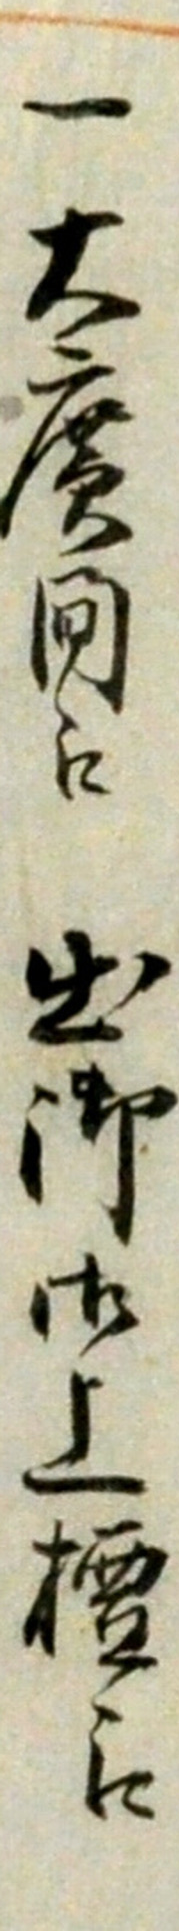一大広間え出御御上壇え
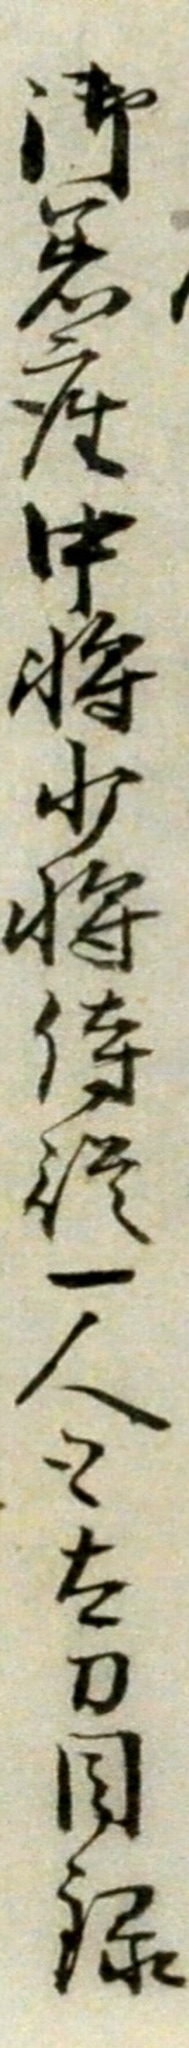御着座中将少将侍従一人ツヽ太刀目録
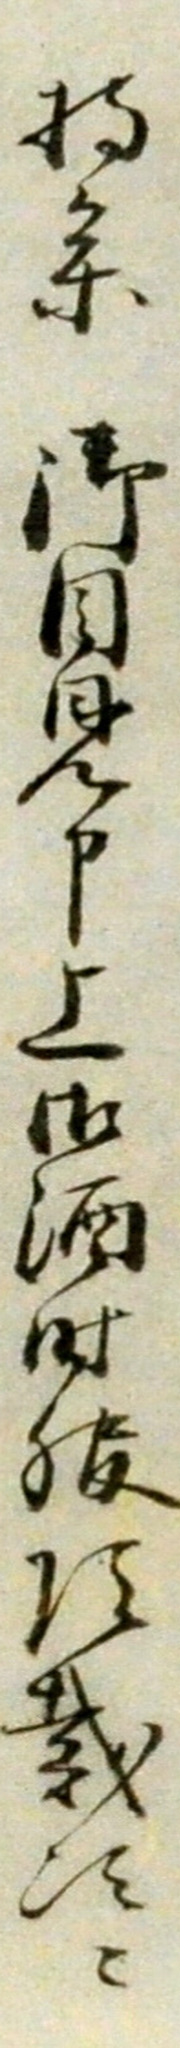持参御目見申上御酒時服頂戴次に
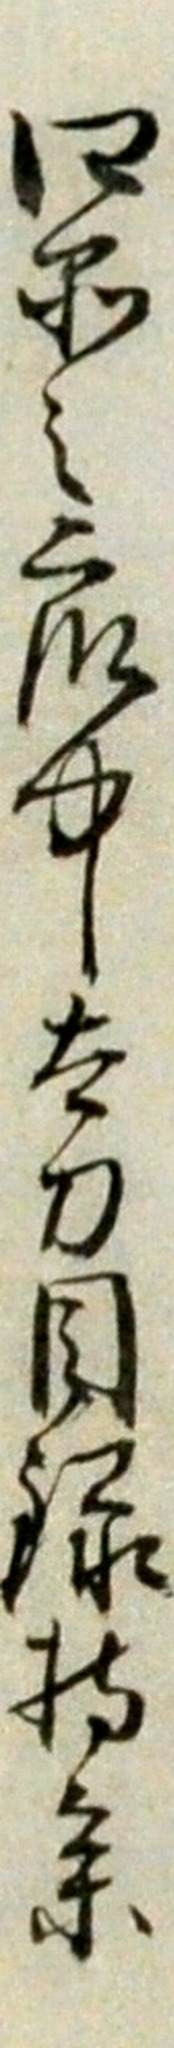四品之衆中太刀目録持参
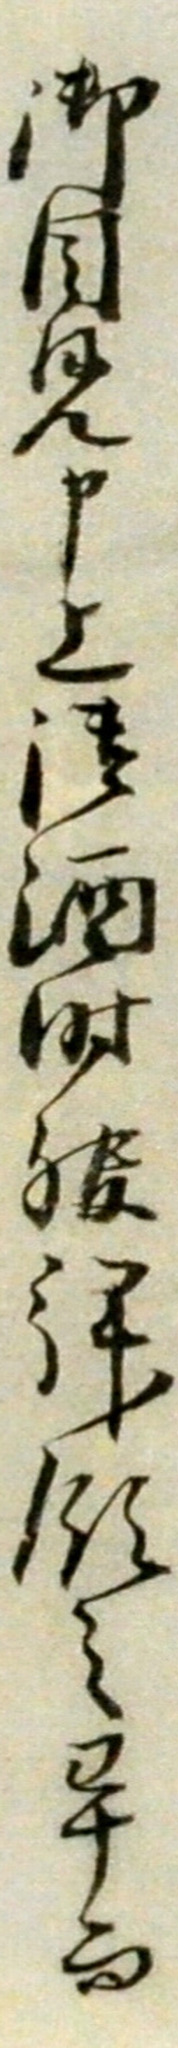御目見申上御酒時服拝領之畢て
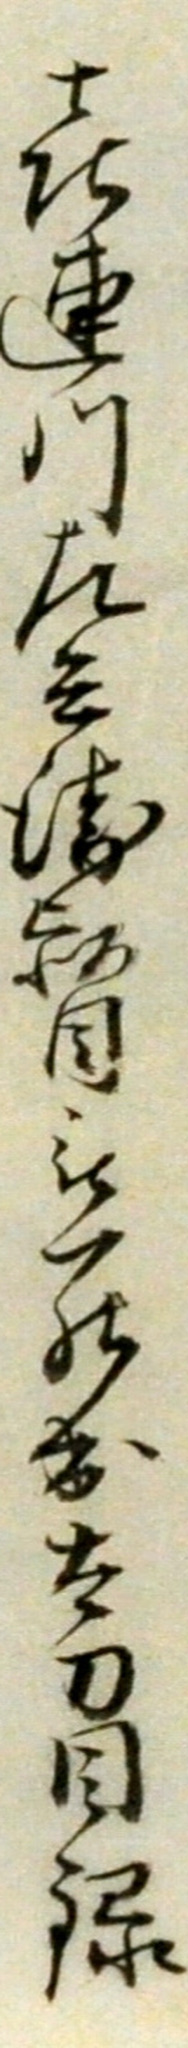喜連川左兵衛督被罷出太刀目録
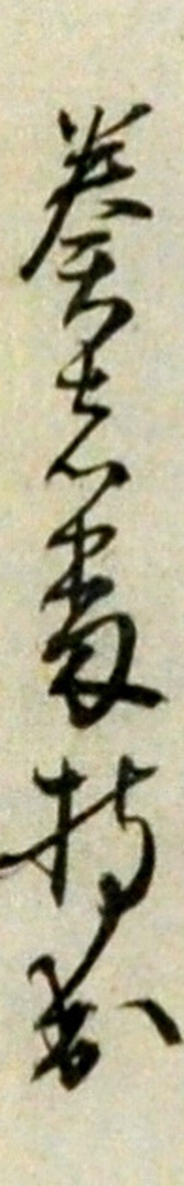奏者番持出
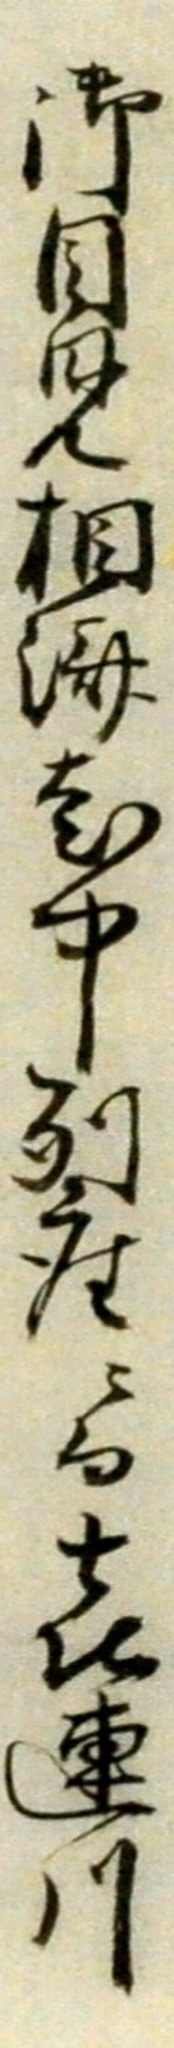御目見相済老中列座にて喜連川
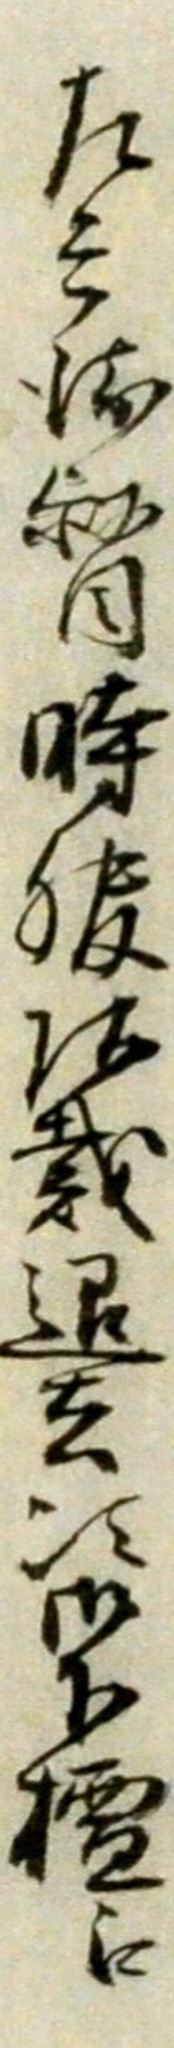左兵衛督時服頂戴退去次御下壇え
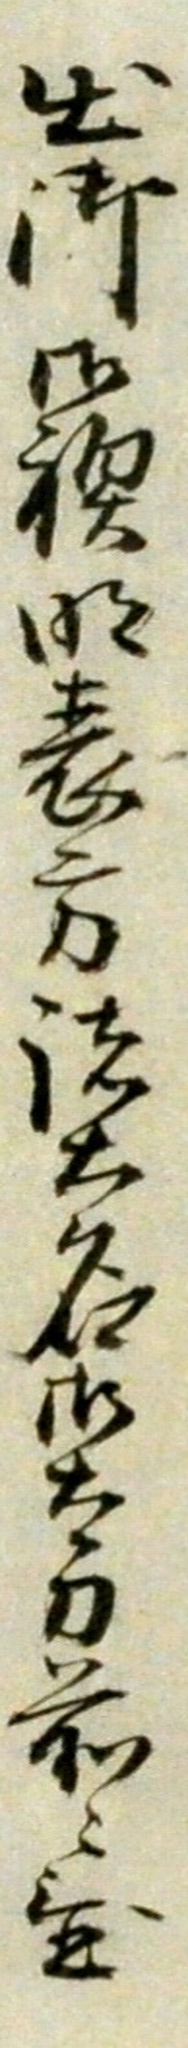出御御襖明表方諸大名御太刀前に置
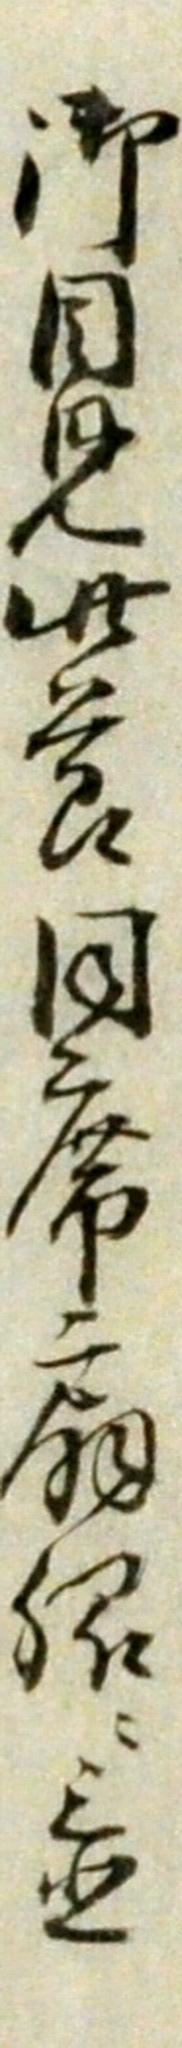御目見此節同席扇脇に置
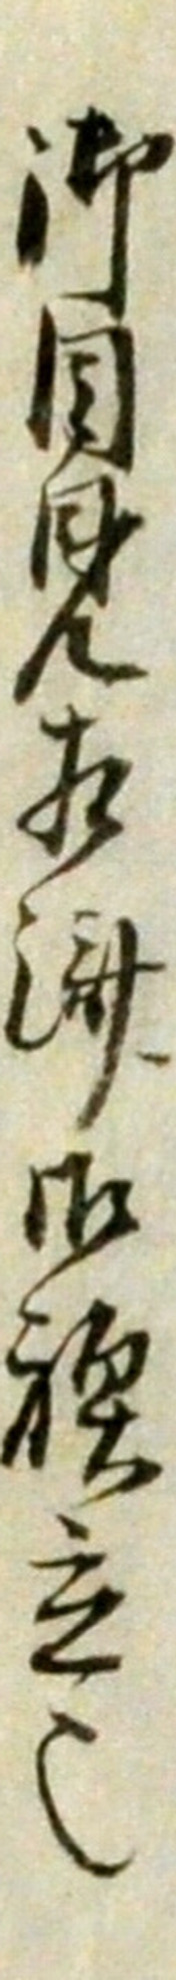御目見相済御襖立之
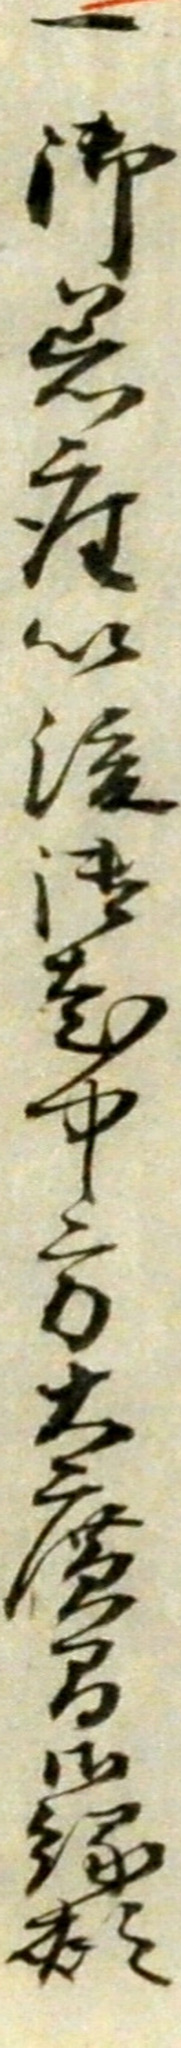一着座以後御老中方大広間御縁頬
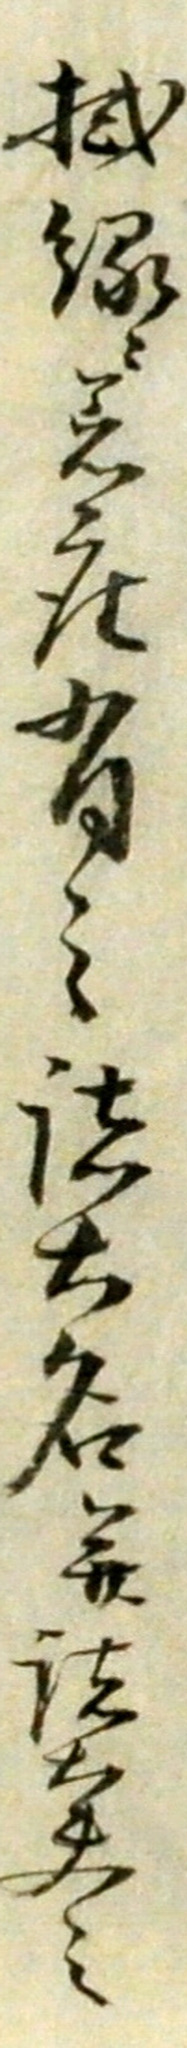拭縁に着座有之諸大名并諸大夫之
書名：申合帳〔一括〕
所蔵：伊那市立高遠町図書館・合同会社AMANE
